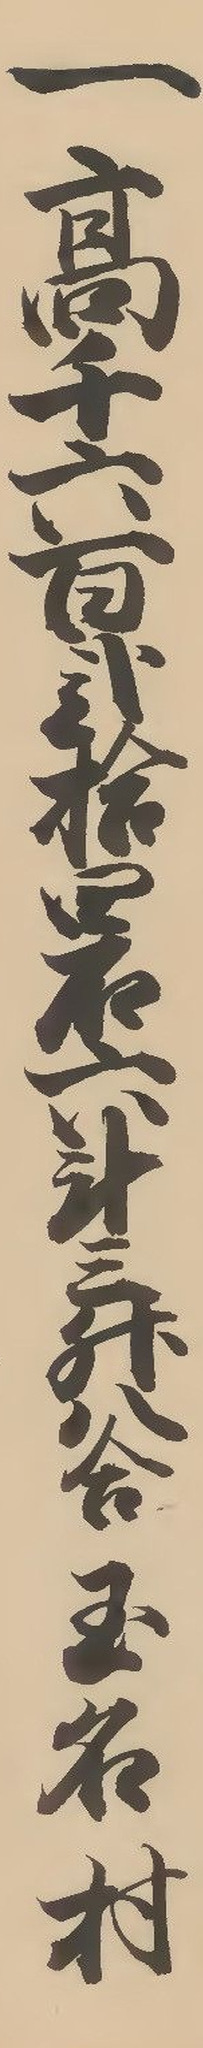一髙千六百弐拾四石六斗三升八合玉名村
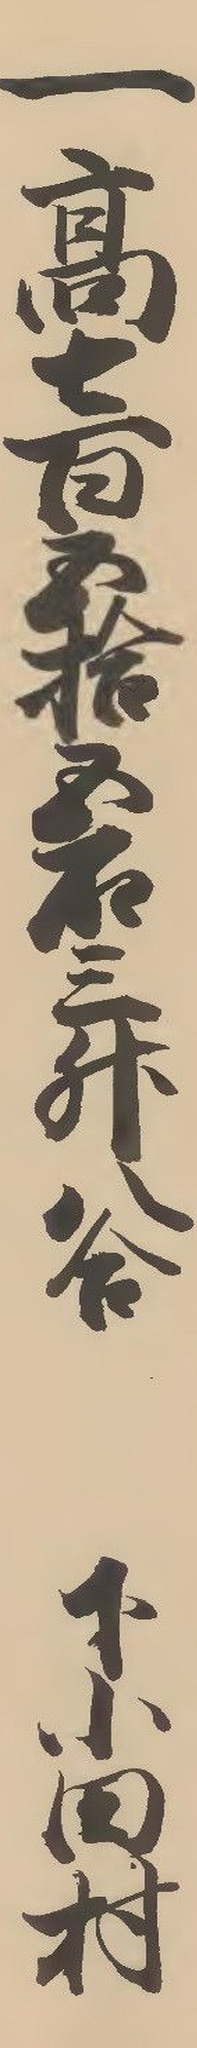一髙七百五拾五石三升八合下小田村
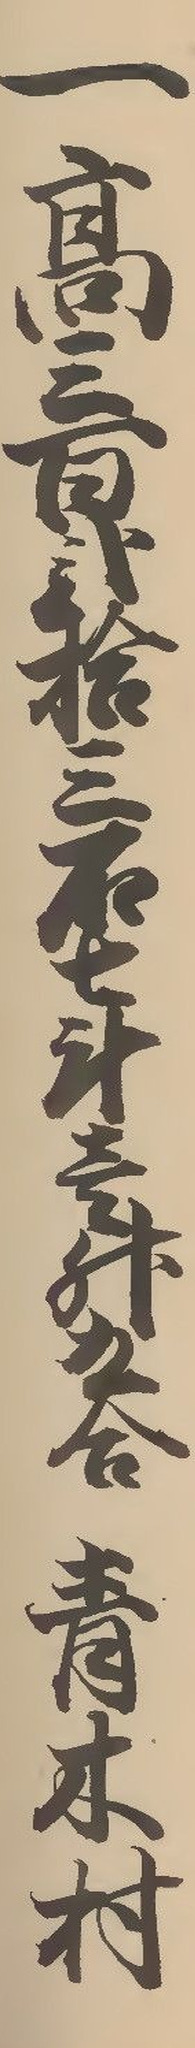一髙三百弐拾三石七斗壱升九合青木村
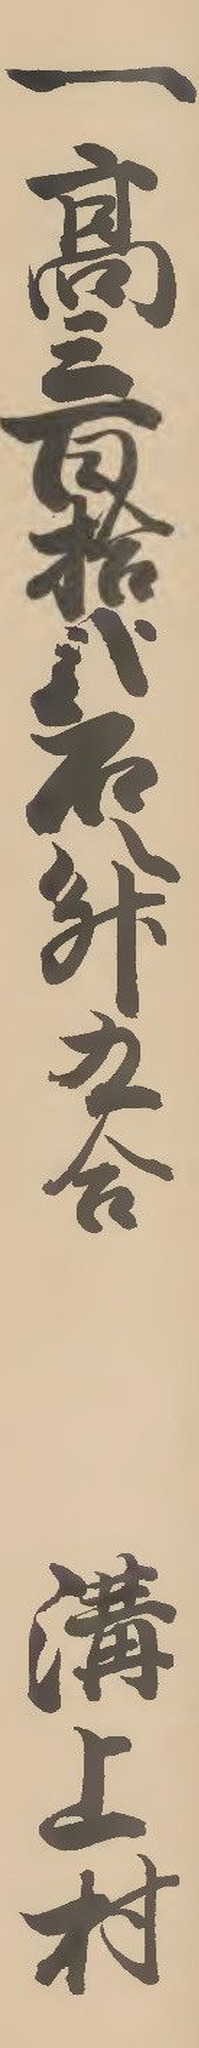一髙三百拾弐石八升九合溝上村
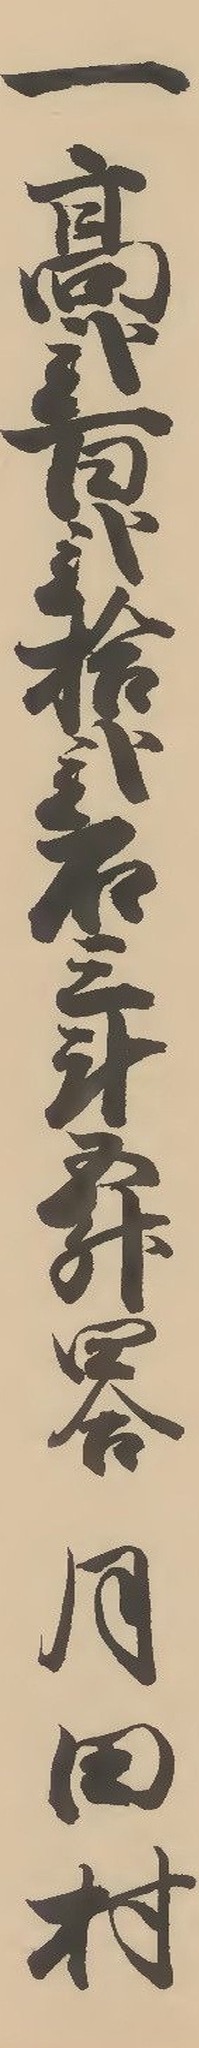一髙弐百弐拾弐石三斗五升四合月田村
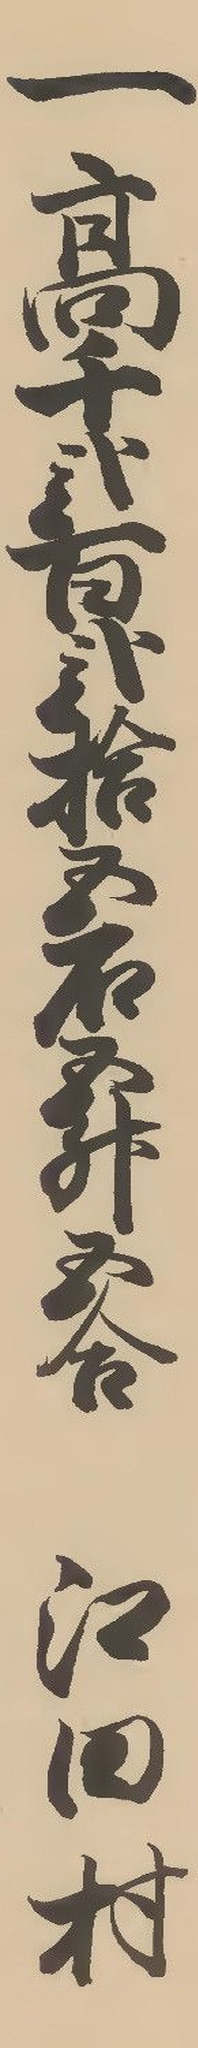一髙千弐百弐拾五石五升五合江田村
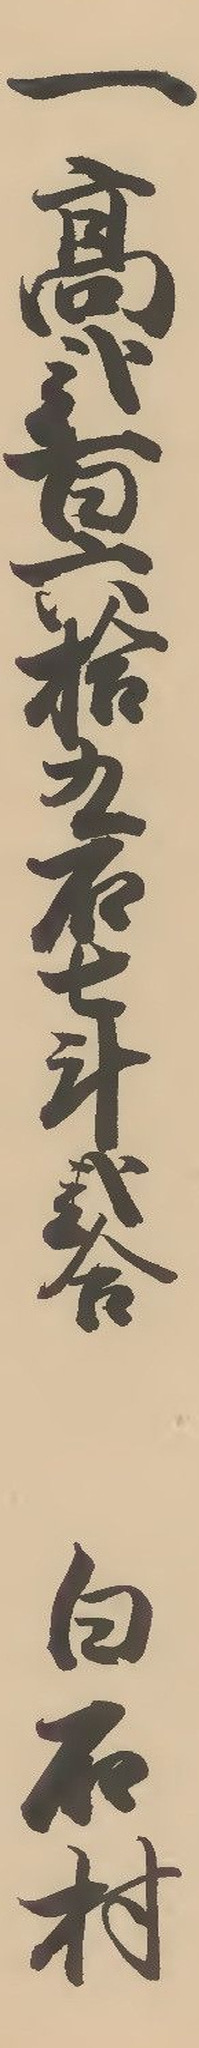一髙弐百六拾九石七斗弐合白石村

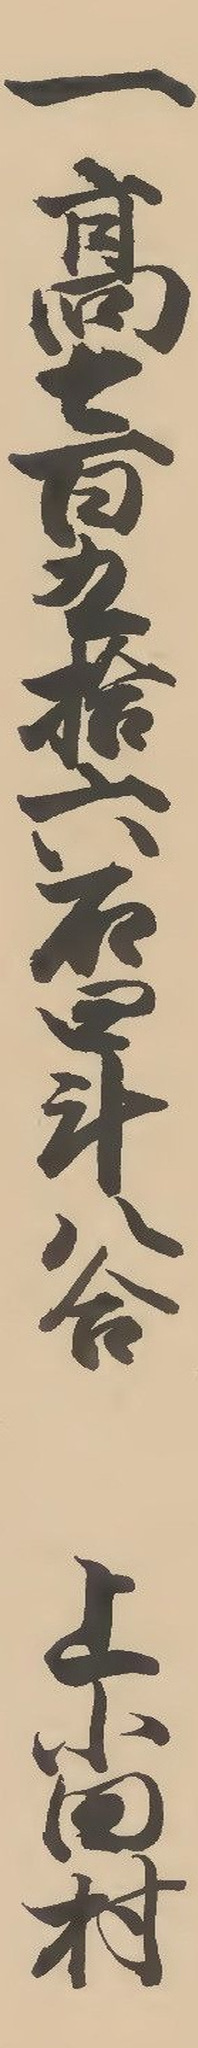一髙七百九拾六石四斗八合上小田村
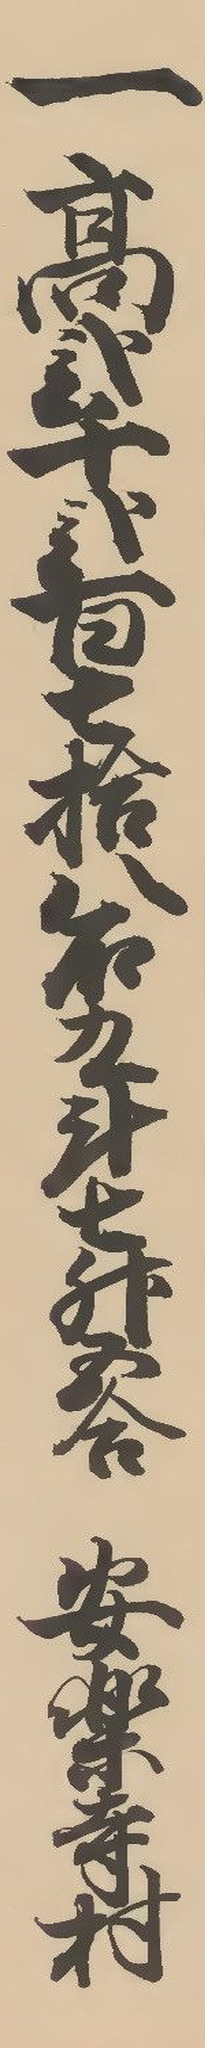一髙弐千弐百七拾八石九斗七升五合安樂寺村
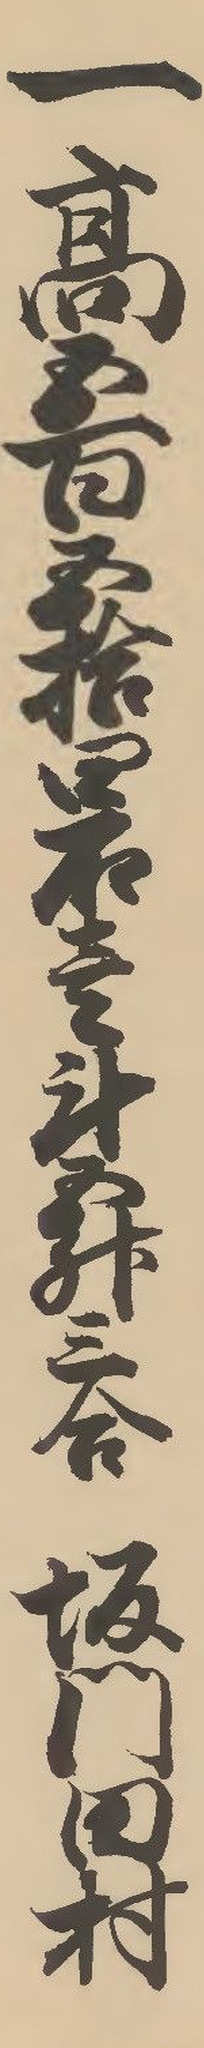一髙五百五拾四石壱斗五升三合坂門田村
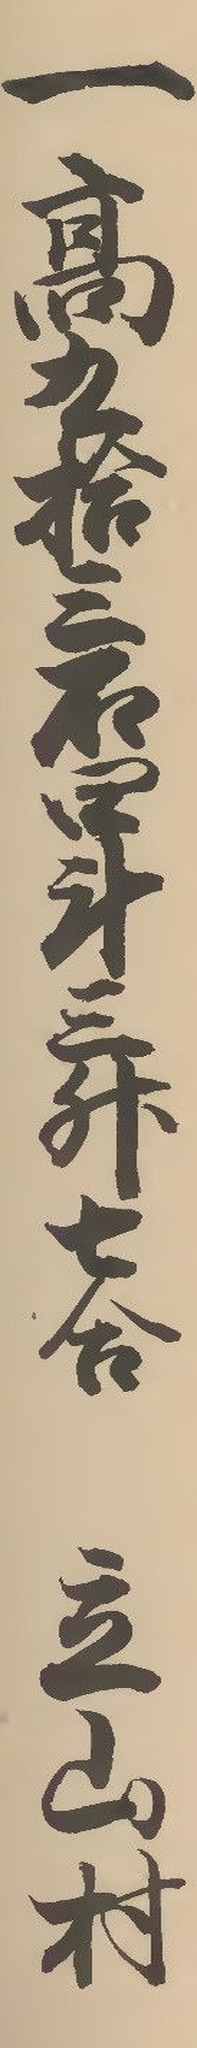一髙九拾三石四斗三升七合立山村
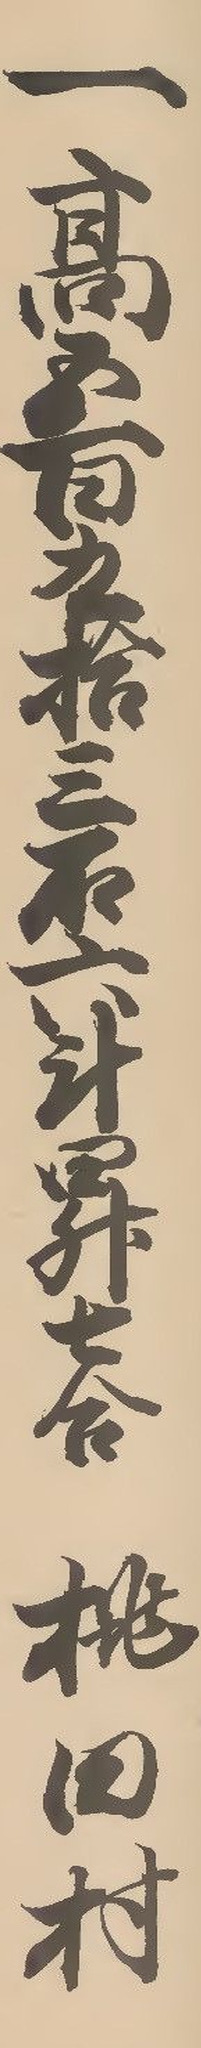一髙五百九拾三石六斗四升七合桃田村
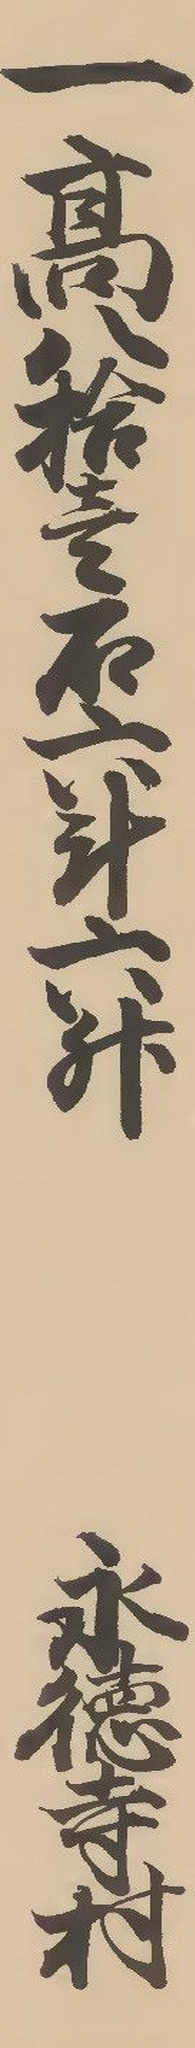一髙八拾壱石六斗六升永徳次村
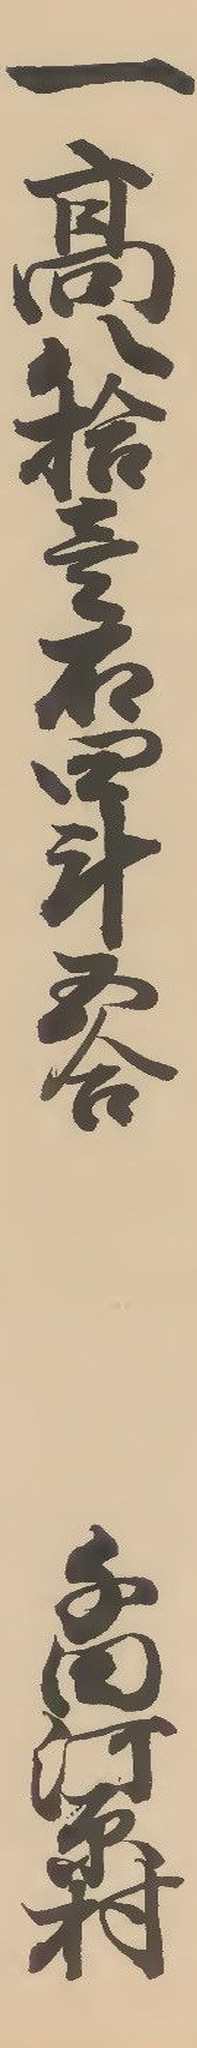一髙八拾壱石四斗五合千田河原村
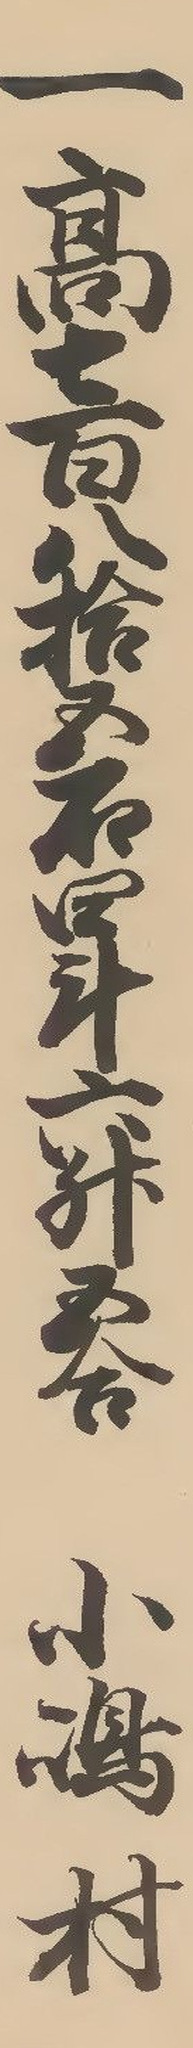一髙七百八拾五石四斗六升五合小嶋村

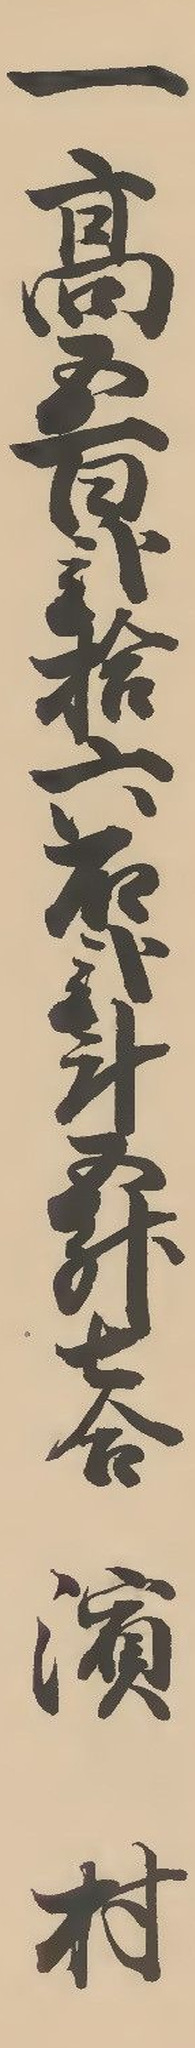一髙五百弐拾六石弐斗五升七合濱村
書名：肥後国郷帳
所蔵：国立公文書館 National Archives of Japan
